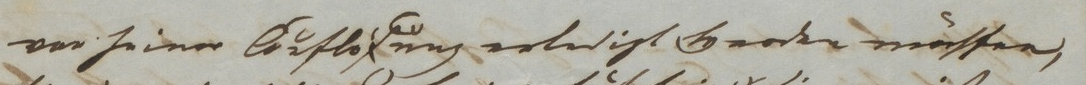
vor seiner Auflösung erledigt werden müssen,
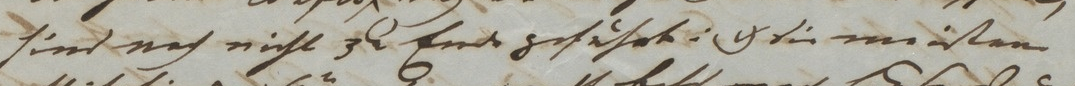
sind noch nicht zu Ende geführt: & die meisten
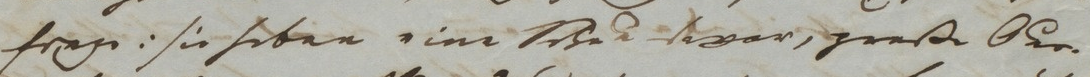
frage: sie haben eine Scheu davor, große Aus-
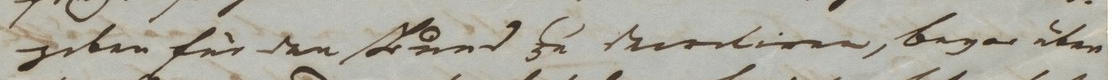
gaben für den Bund zu decretiren, bevor über
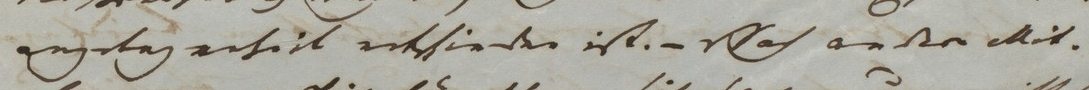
angelegenheit entschieden ist. – Noch andere Mit-
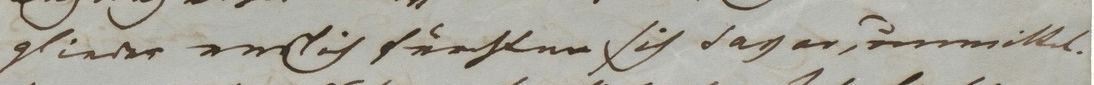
glieder endlich fürchten sich davor, unmittel-
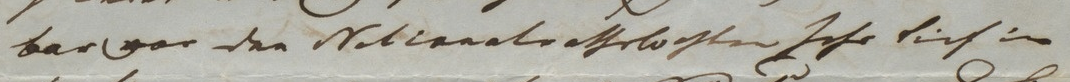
bar vor den Nationalrathswahlen sehr tief in
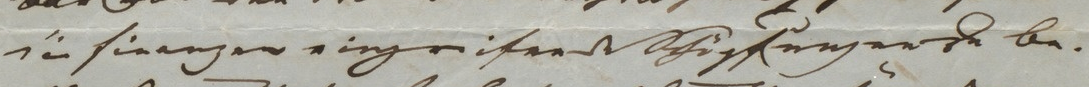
die Finanzen eingreifende Schöpfungen zu be-
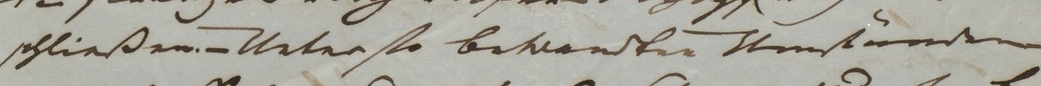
schließen. – Unter so bewandten Umständen
